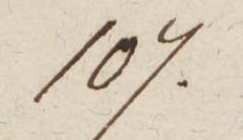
107.
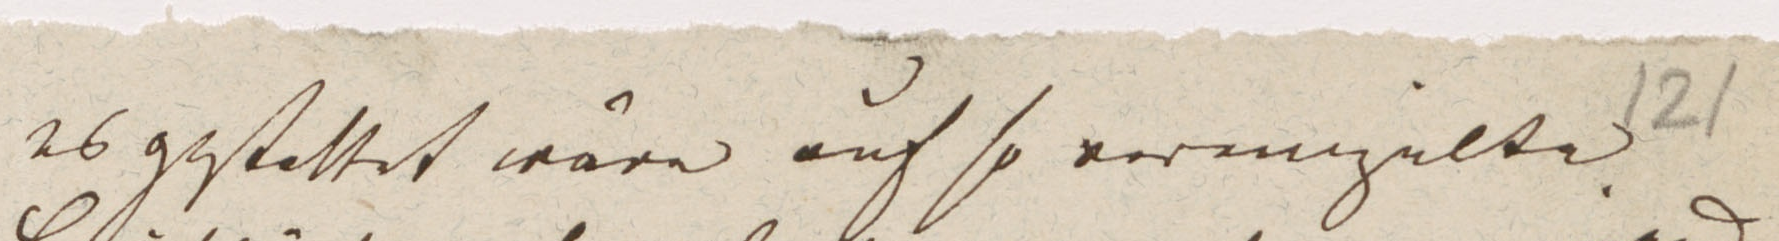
es gestattet wäre auf so vereinzelte
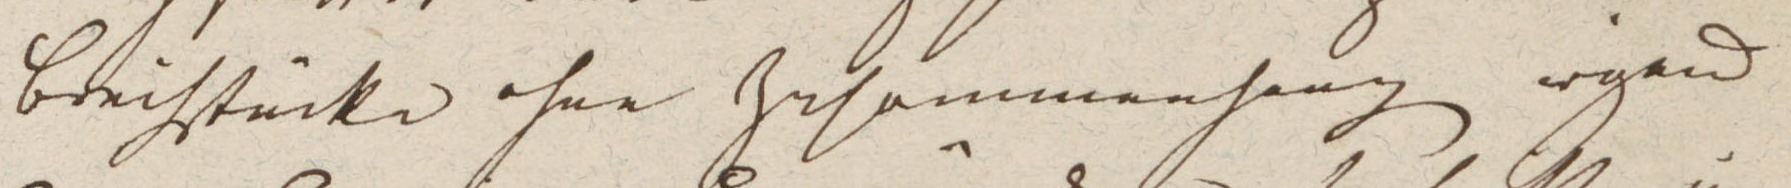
Bruchstücke ohne Zusammenhang irgend
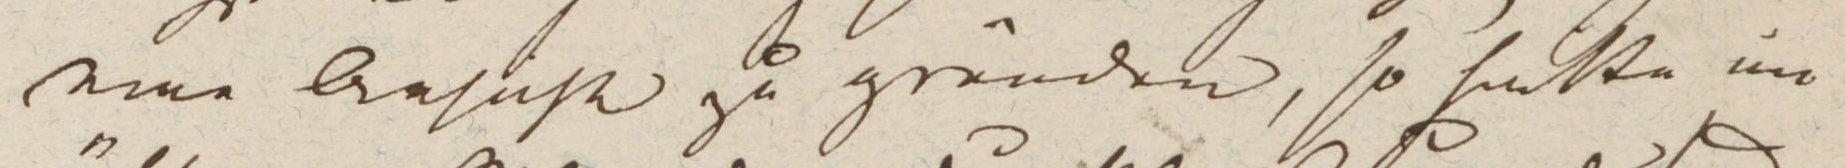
eine Ansicht zu gründen, so hätte im
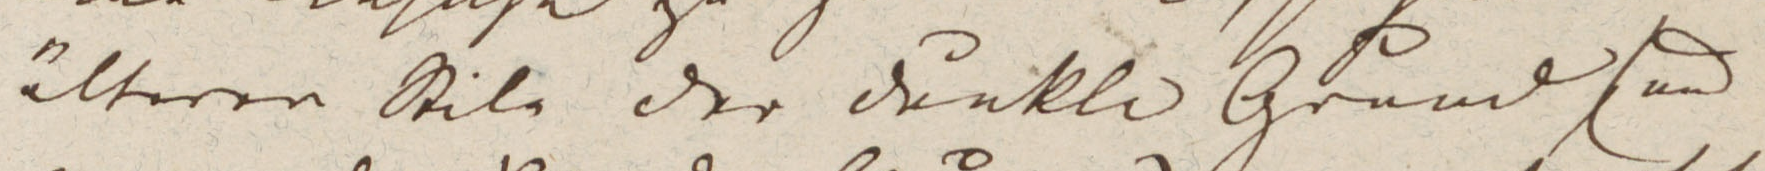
älteren Stile der dunkle Grund, (und
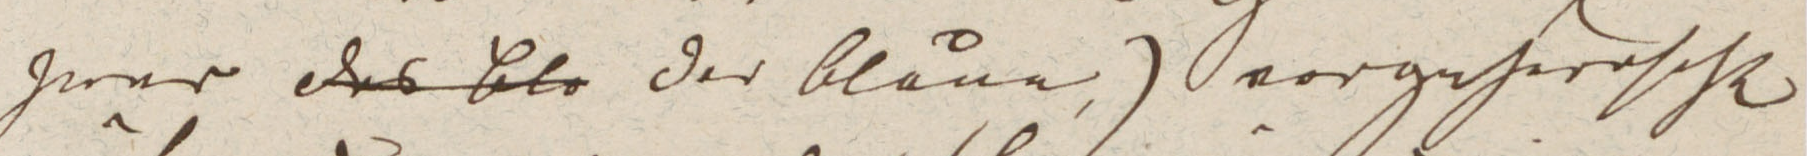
zwar das Bla der Blaue,) vorgeherrscht
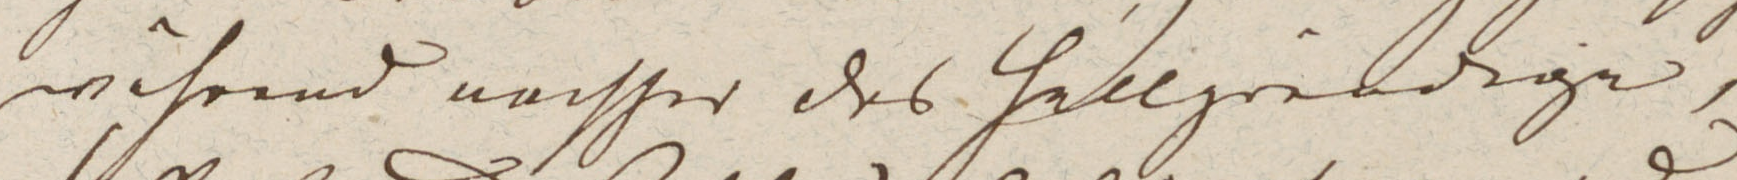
während nachher das Hellgründige,
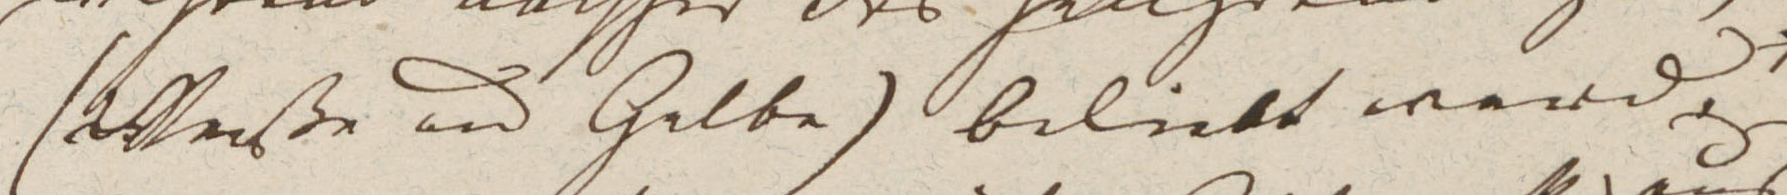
(Weisse und Gelbe) beliebt ward. %
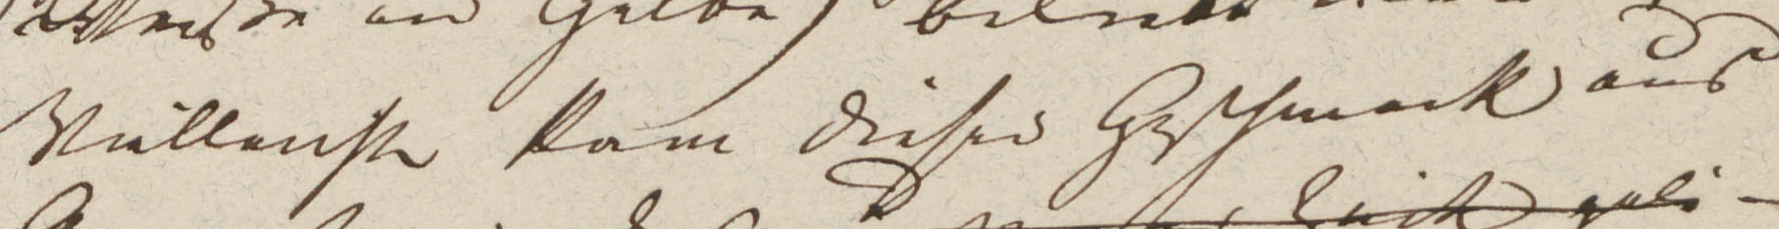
Vielleicht kam dieser Geschmack aus
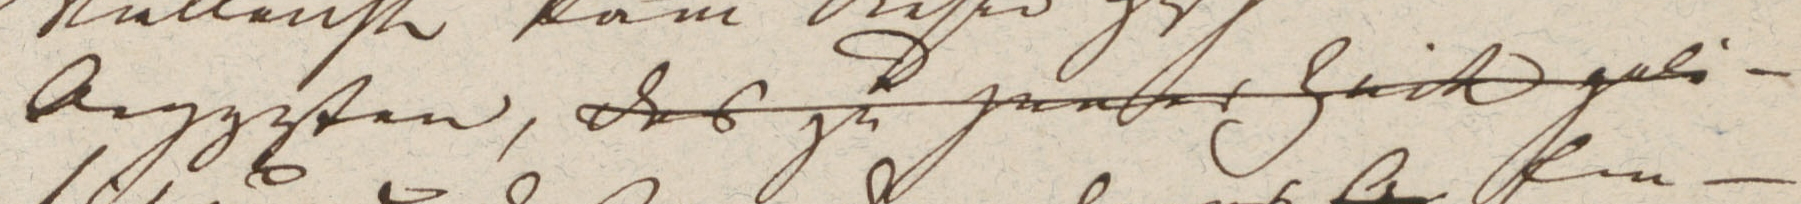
Aegypten, das zu jener Zeit poli-
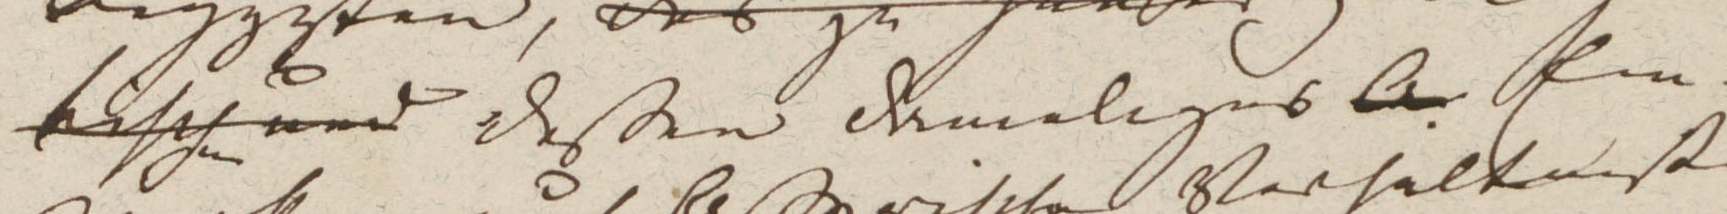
tisch und dessen damaliges A Ein-
